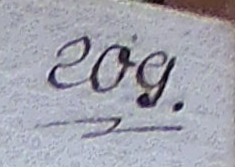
209.
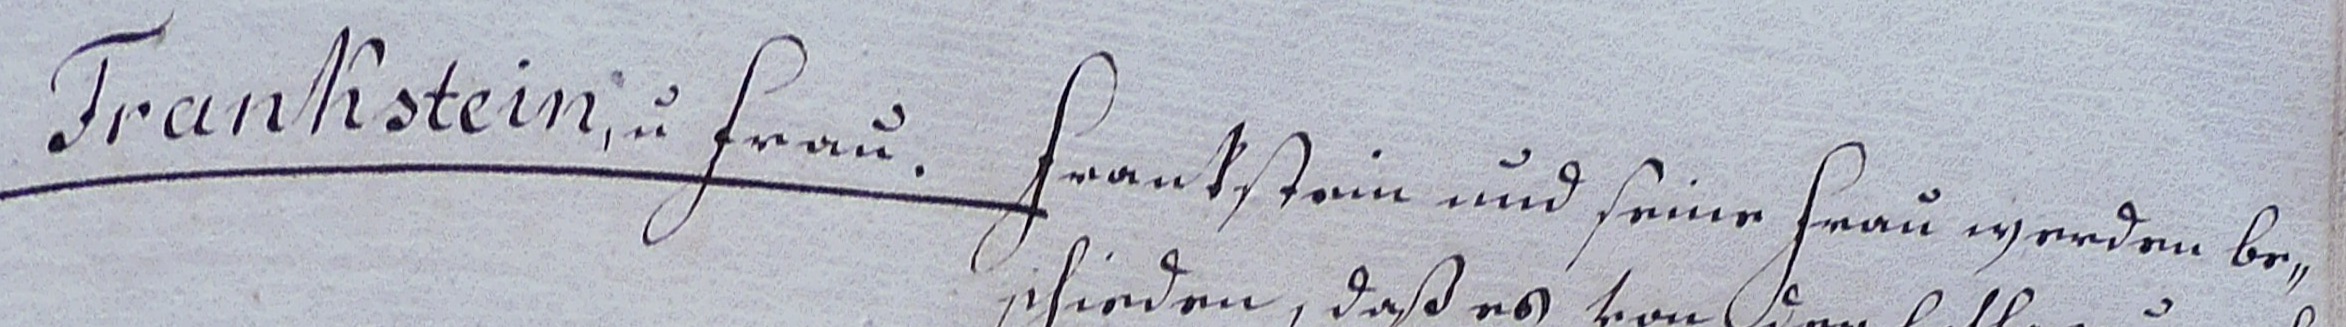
Frankstein, u Frau. Frankstein und seine Frau werden be¬
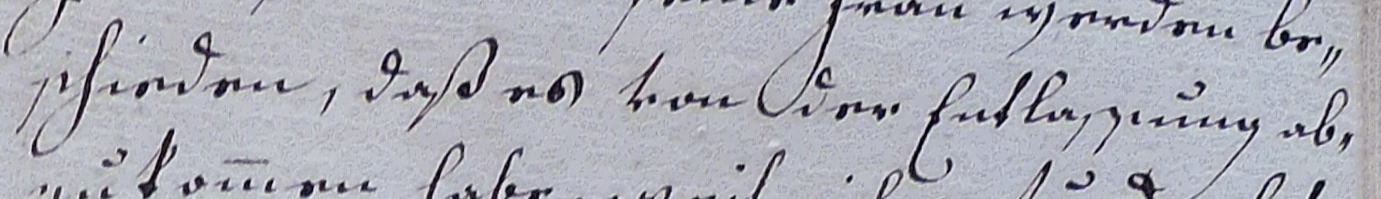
schieden, daß es von der Entlassung ab¬
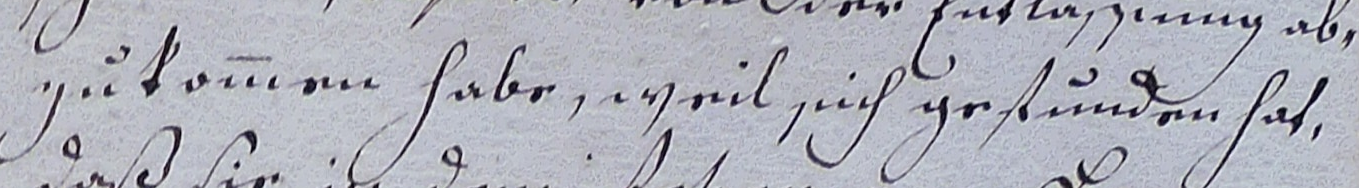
zukom̅en habe, weil sich gefunden hat,
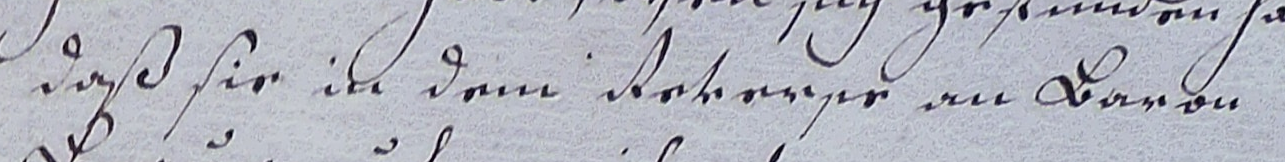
daß sie in dem Reverse an Baron
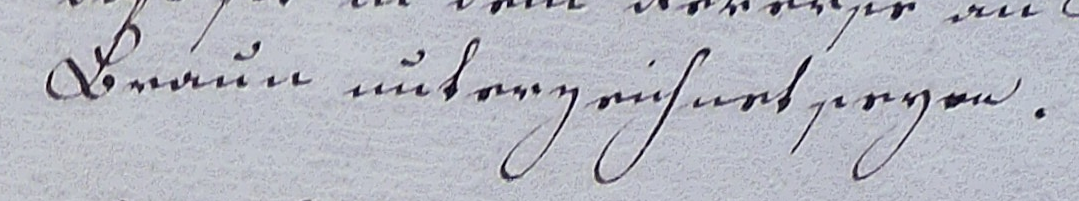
Braun unterzeichnet seyen.
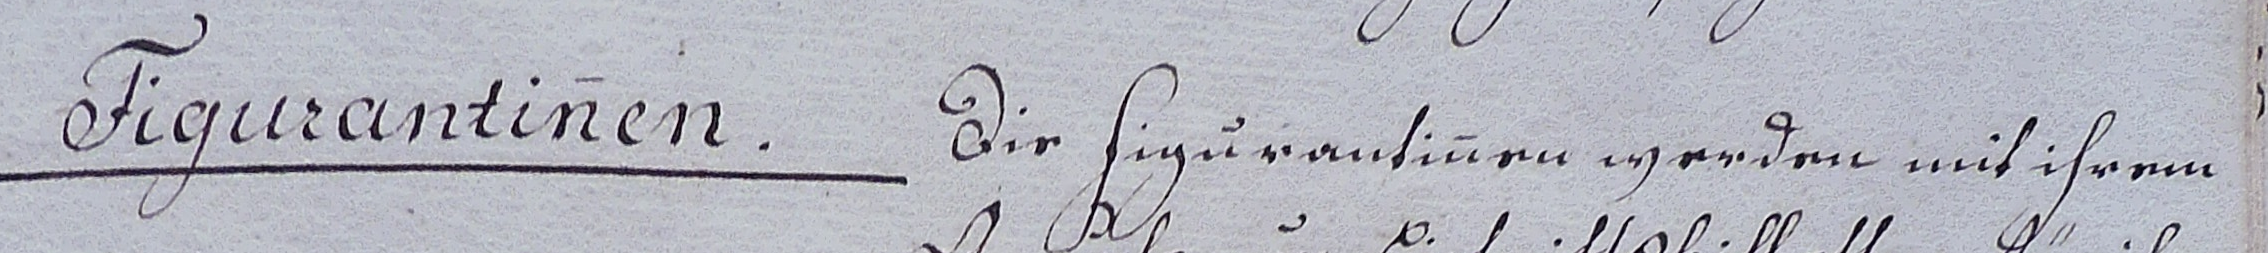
Figurantin̅en. Die Figurantin̅en werden mit ihrem
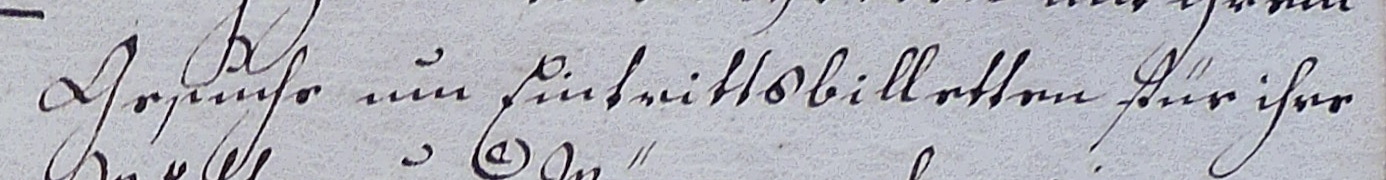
Gesuche um Eintrittsbilletten für ihre
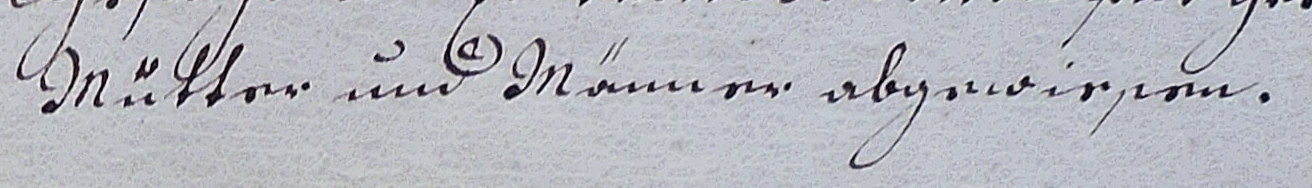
Mütter und Männer abgewiesen.
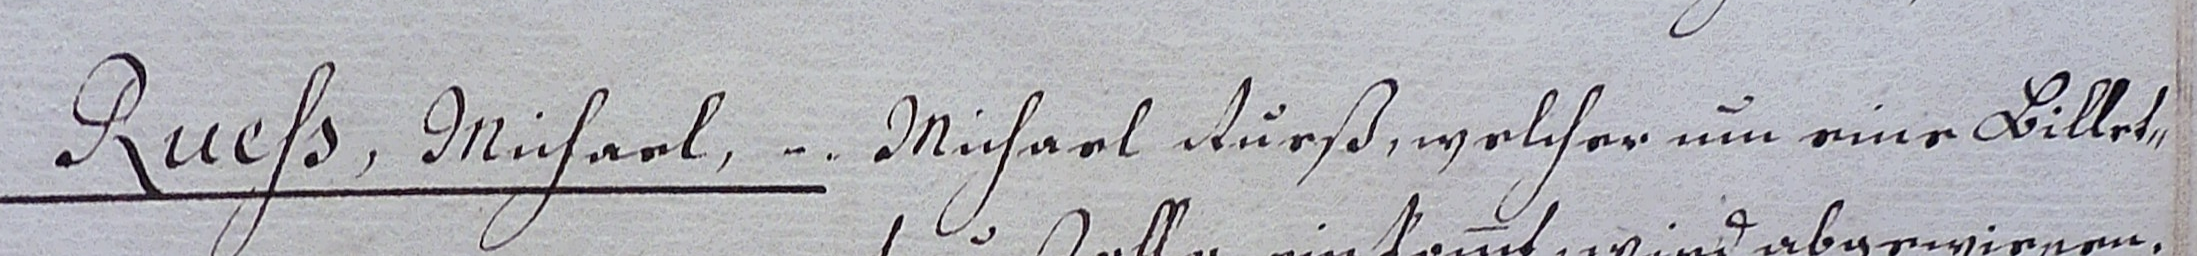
Ruess, Michael, .. . Michael Rueß, welcher um eine Billet¬
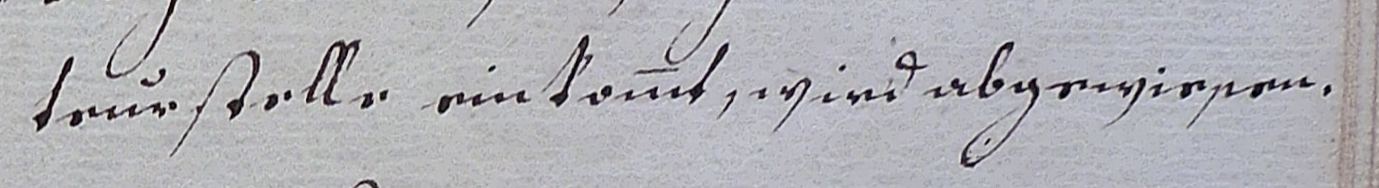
teurstelle einkom̅t, wird abgewiesen.
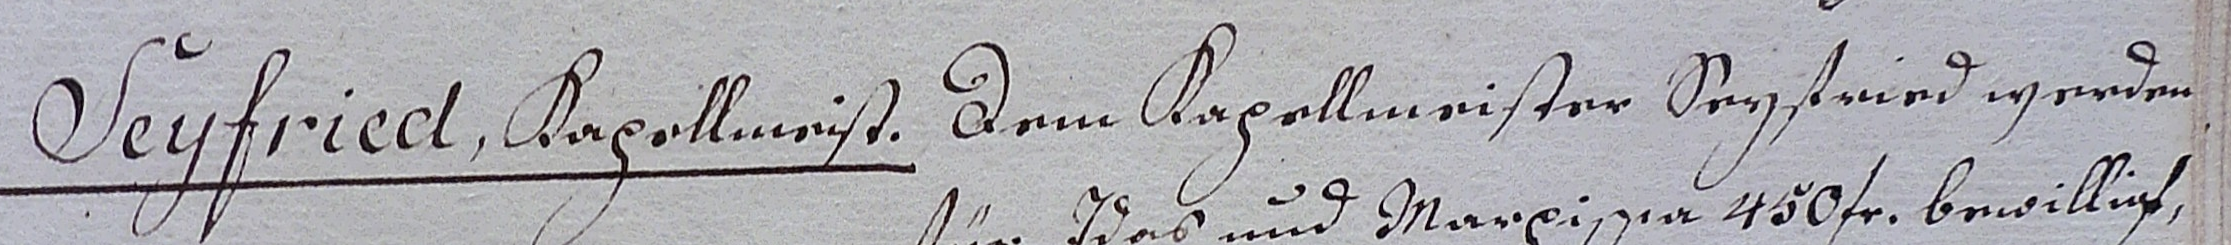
Seyfried, Kapellmeist. Dem Kapellmeister Seyfried werden
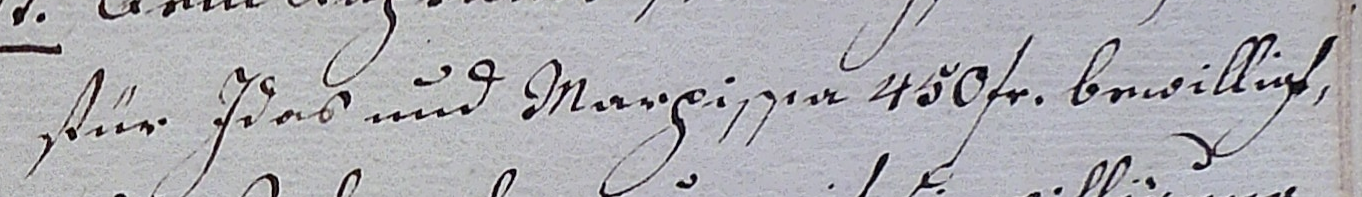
für Idas und Marpissa 450fr. bewilligt,
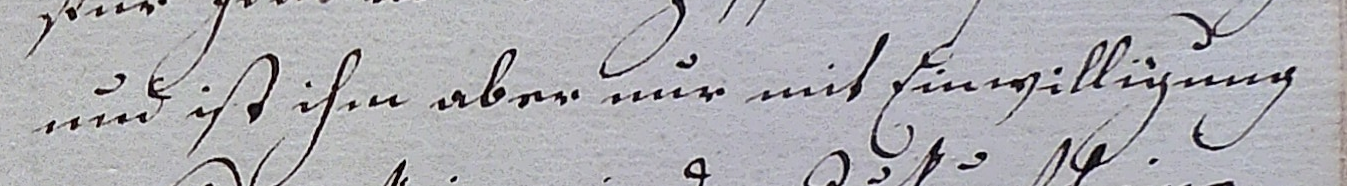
und ist ihm aber nur mit Einwilligung
